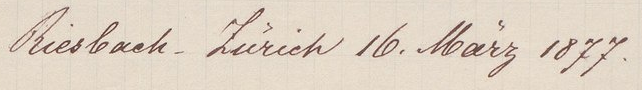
Riesbach–Zürich16. März 1877.
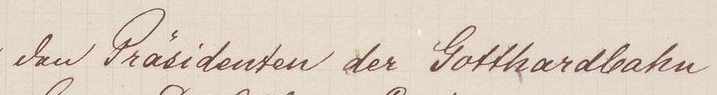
den Präsidenten der Gotthardbahn
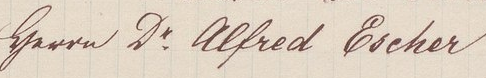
Herrn Dr Alfred Escher
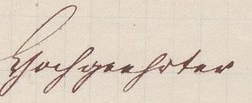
Hochgeehrter
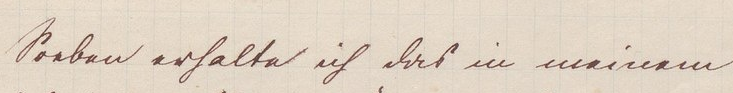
Soeben erhalte ich das in meinem
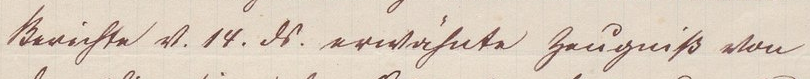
Berichte v. 14. ds. erwähnte Zeugniß von
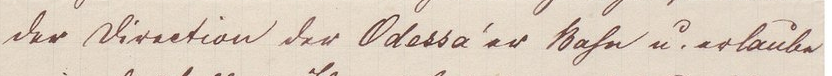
der Direction der Odessa'er Bahn u. erlaube
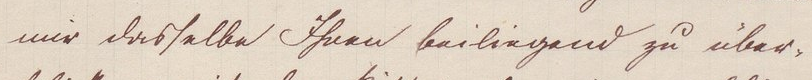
mir dasselbe Ihnen beiliegend zu über-
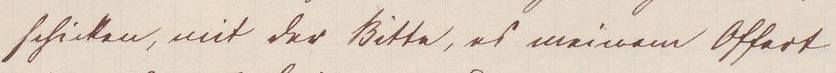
schicken, mit der Bitte, es meinem Offert
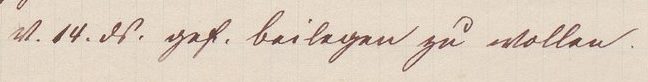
v. 14. ds. gef. beilegen zu wollen.
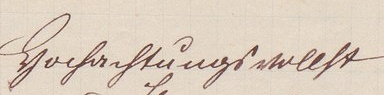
Hochachtungsvollst
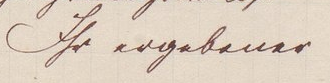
Ihr ergebener
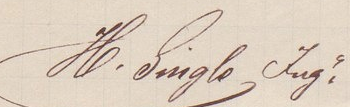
H. Single Ingr
